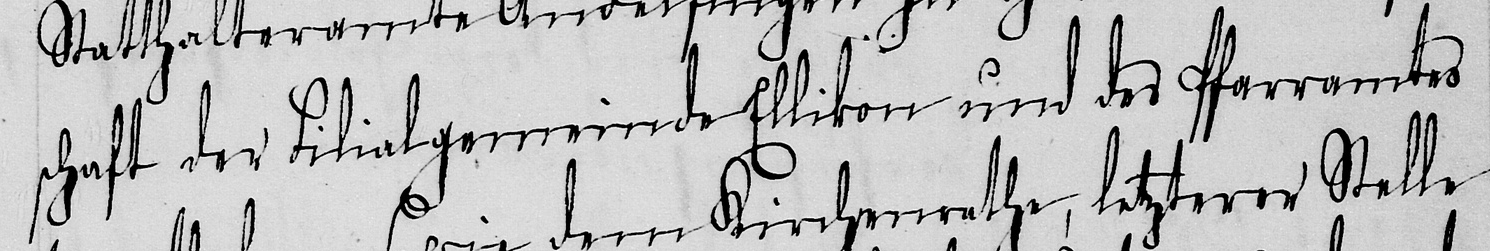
schaft der Filialgemeinde Ellikon und des Pfarramtes
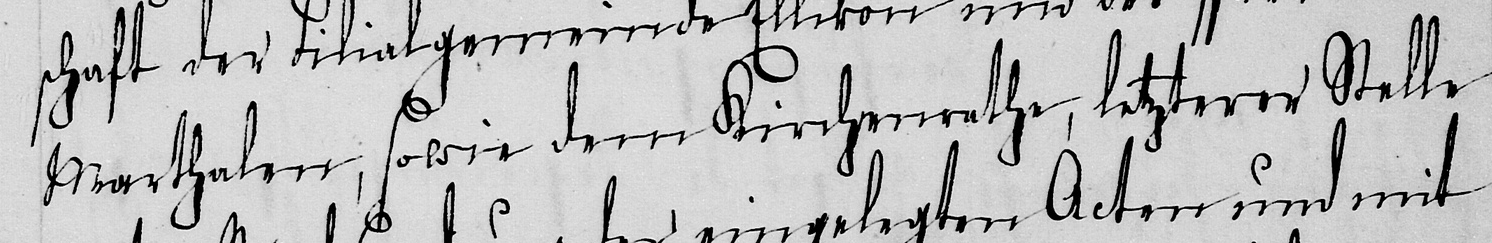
Marthalen, sowie dem Kirchenrathe, letzterer Stelle
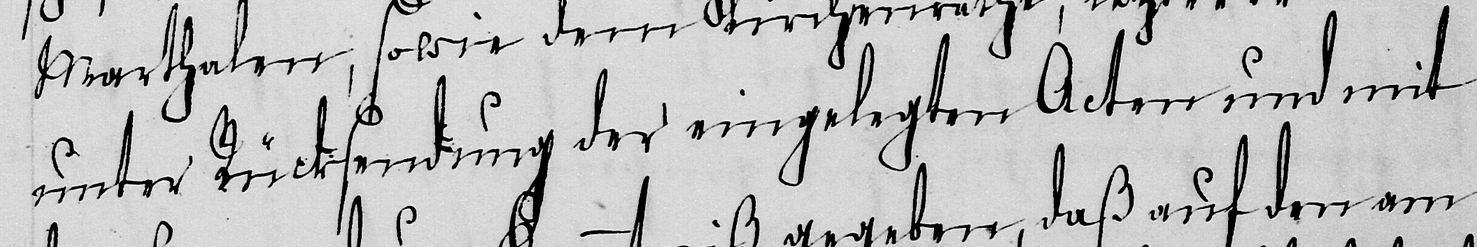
unter Rücksendung der eingelegten Acten und mit
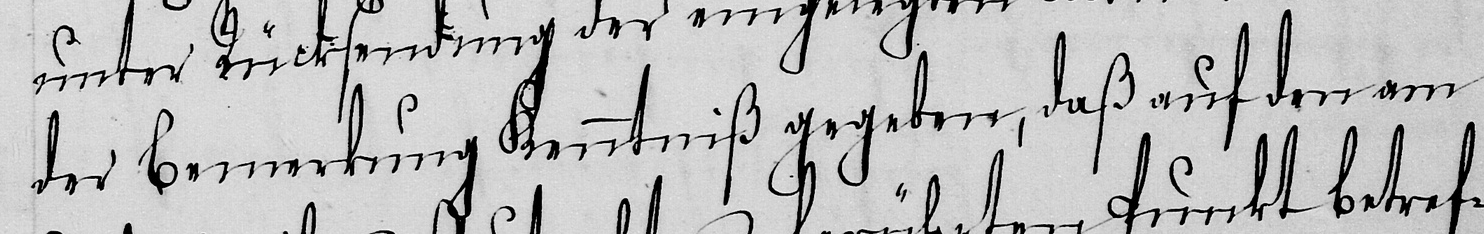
der Bemerkung Kenntniß gegeben, daß auf den am
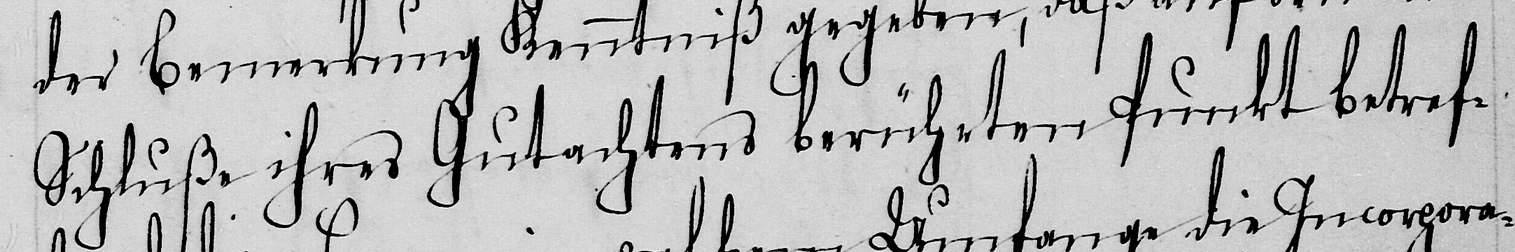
Schluße ihres Gutachtens berührten Punkt betref¬
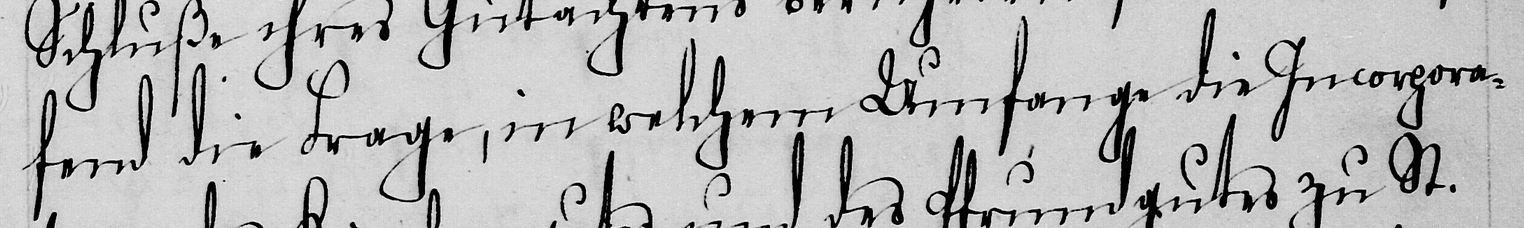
fend die Frage, in welchem Umfange die Incorpora¬
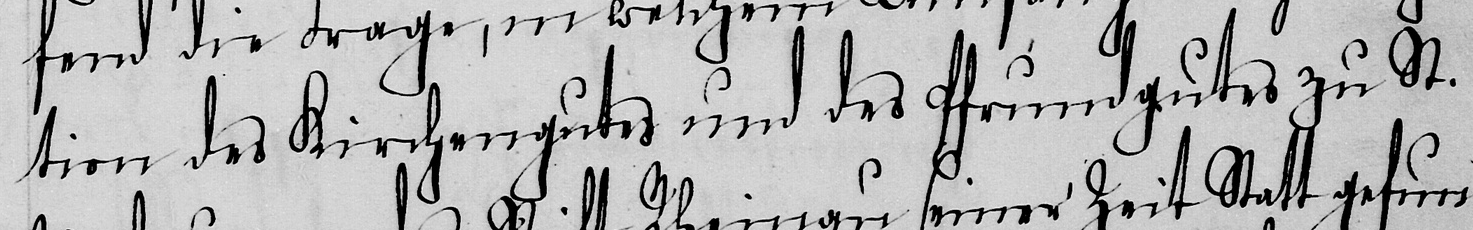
tion des Kirchengutes und des Pfrundgutes zu St.
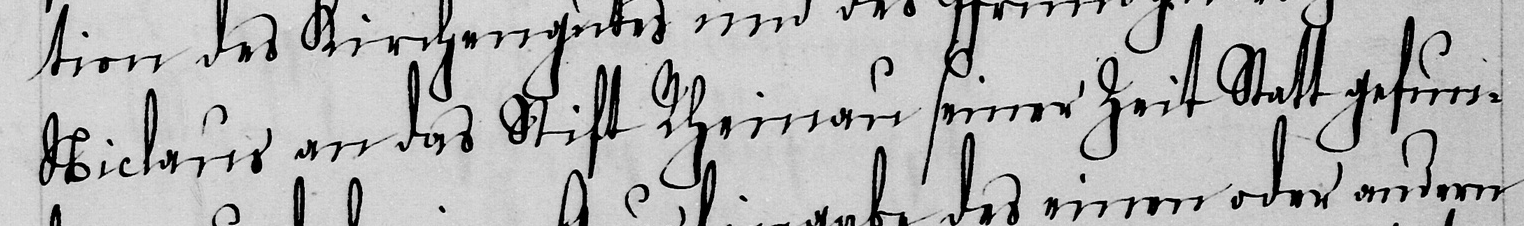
Niclaus an das Stift Rheinau seiner Zeit Statt gefun¬
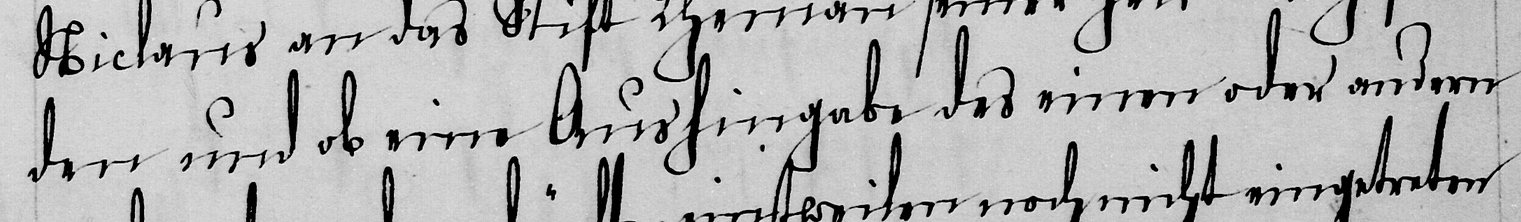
den und ob eine Aushingabe des einen oder andern
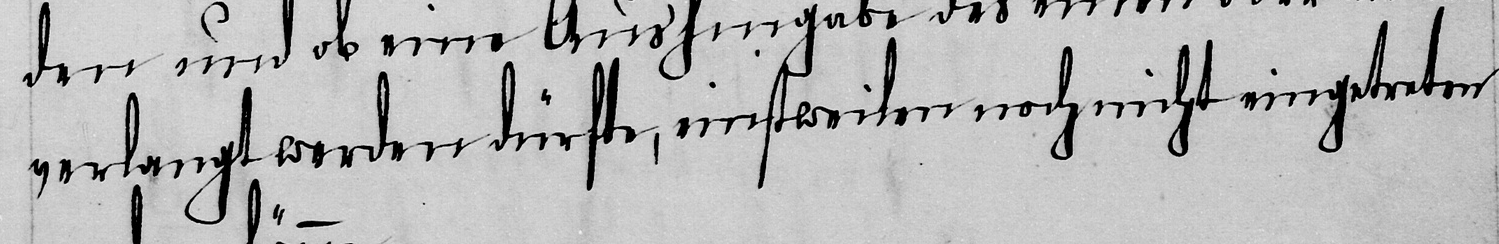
verlangt werden dürfte, einstweilen noch nicht eingetreten
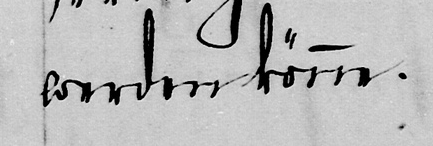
werden könne.
